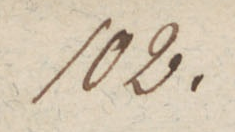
102.
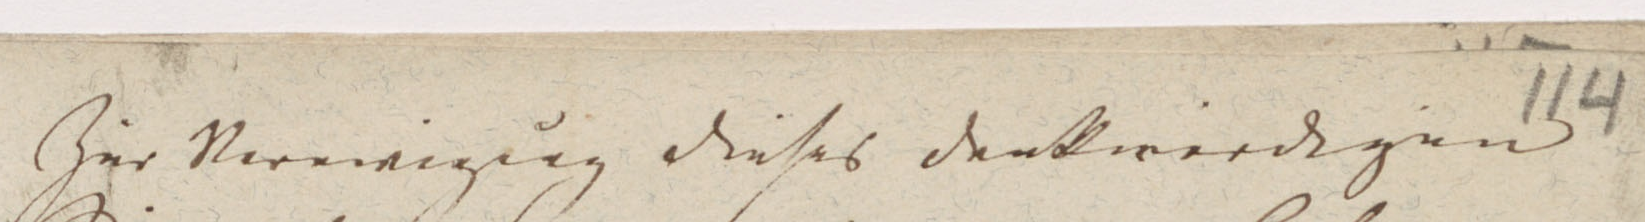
gerade so wie wir diess in dem
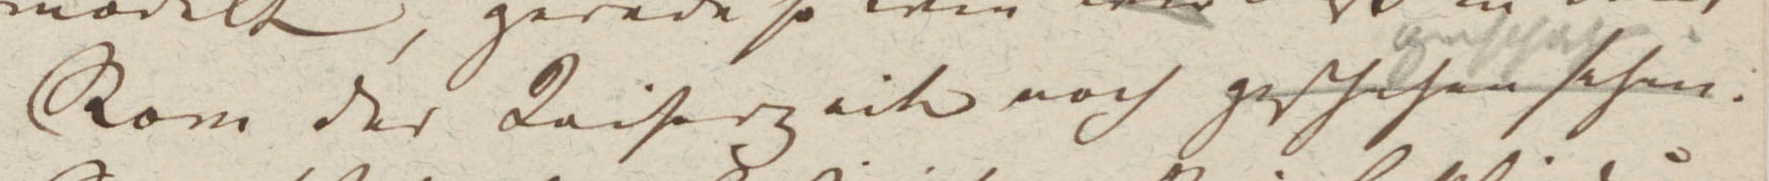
Rom der Kaiserzeit noch geschehen sehen.
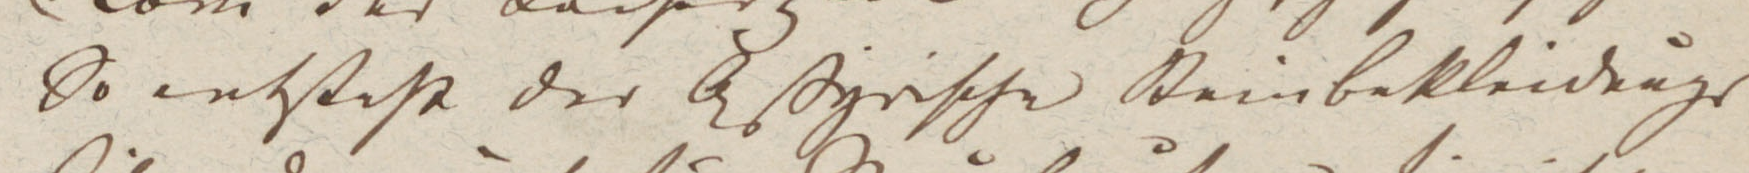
So entsteht der Assyrische Steinbekleidungs
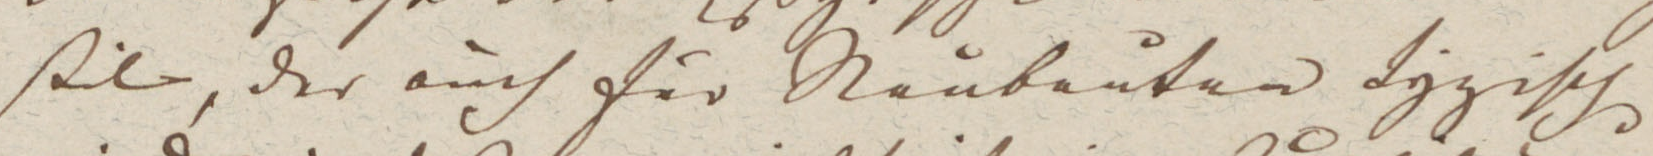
stil, der auch für Neubauten typisch
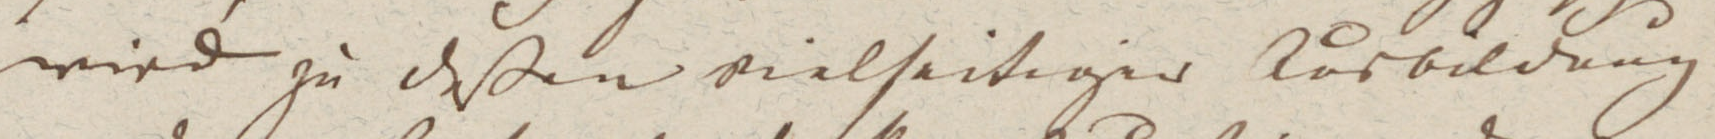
wird zu dessen vielseitiger Ausbildung
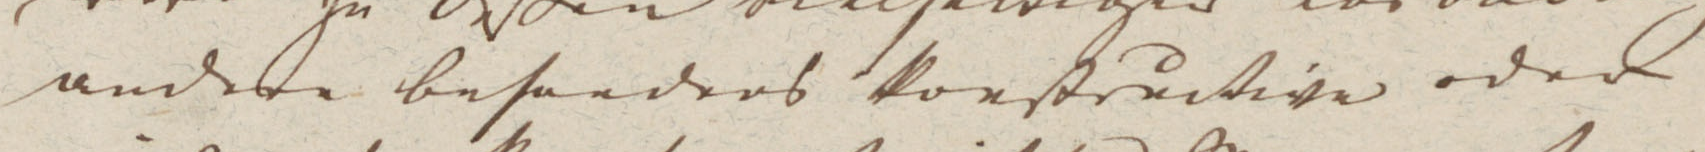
andere besonders konstructive oder
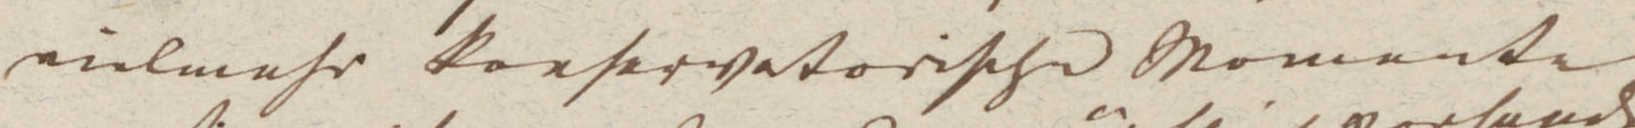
vielmehr konservatorische Momente
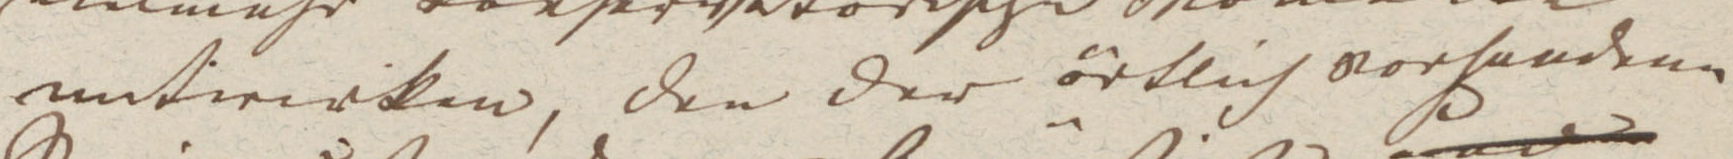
mitwirken, den der örtlich vorhandene
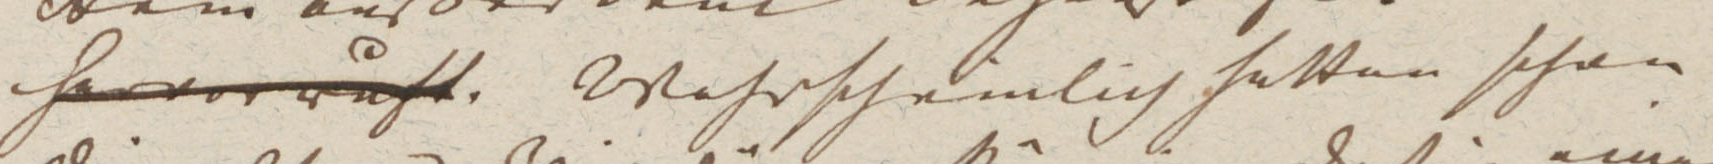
hervorruft. Wahrscheinlich hatten schon
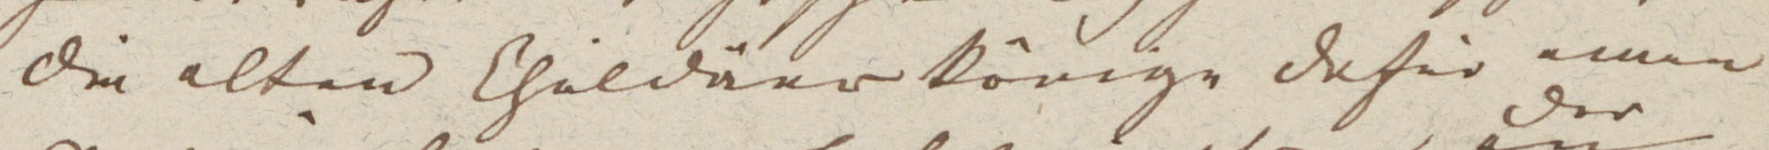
die alten Chaldäerkönige dafür einen
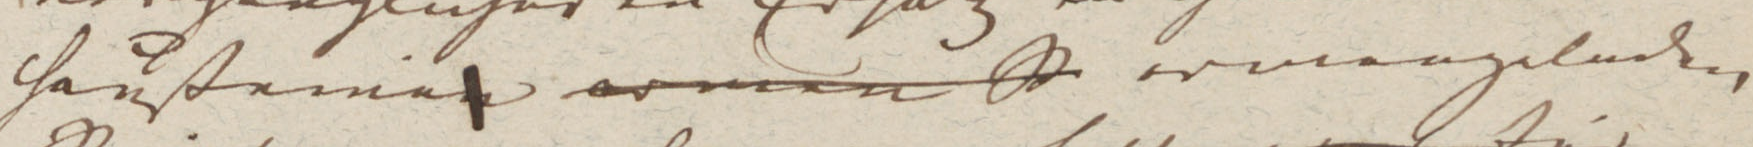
Hausteinen armen St ermangelnden
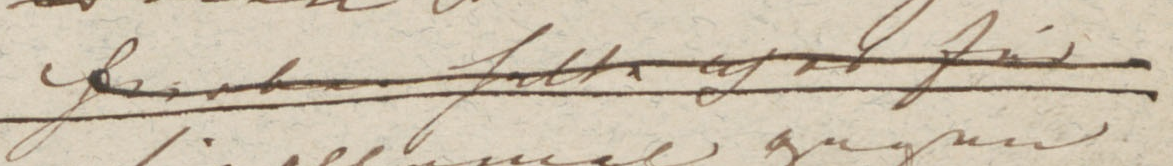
Hierbei halte ich es für %
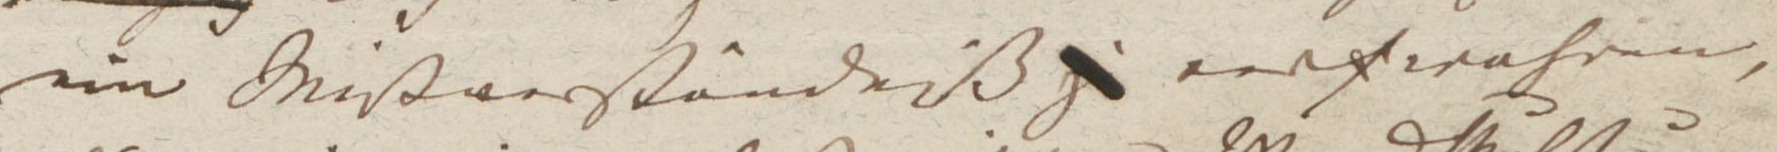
ein Missverständniss zu verswahren,
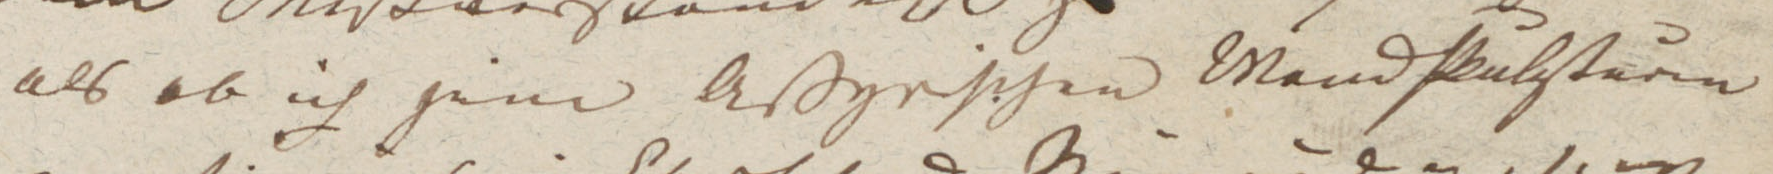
als ob ich jene Assyrischen Wandskulpturen
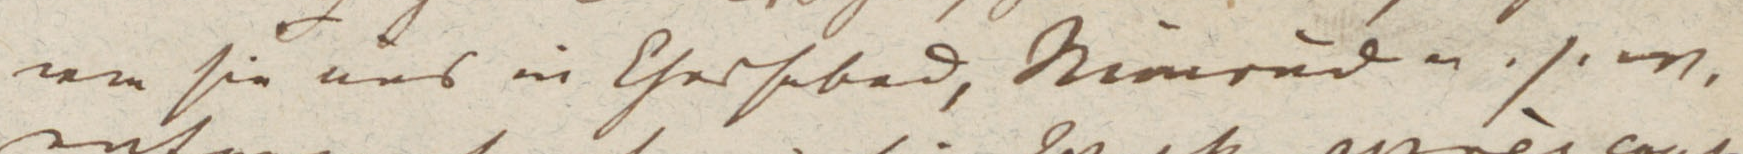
wie sie uns in Chorsabad, Nimrud u. s. w.
